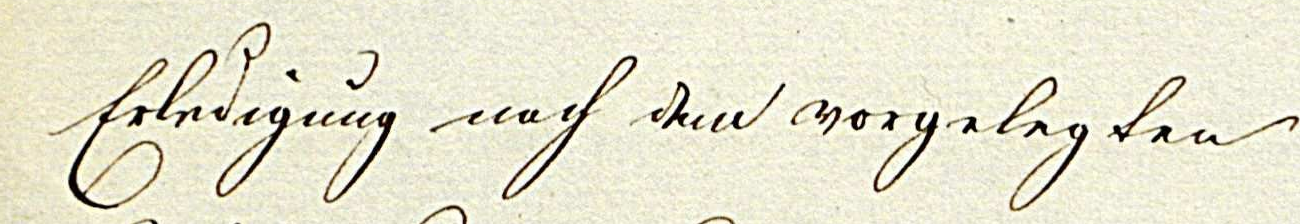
Erledigung nach den vorgelegten
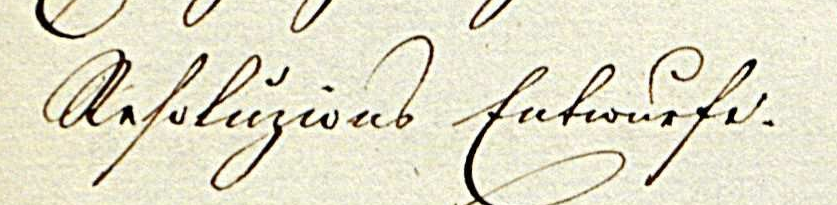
Resoluzions Entwurfe
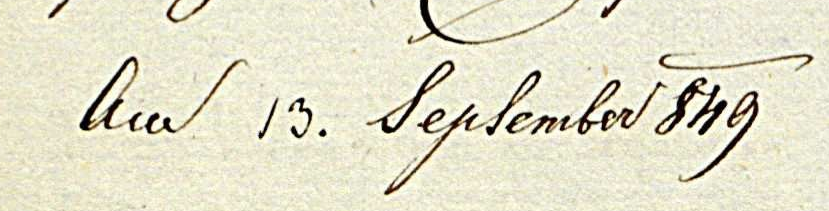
Am 13. September 849
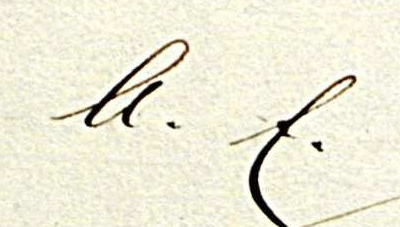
AE
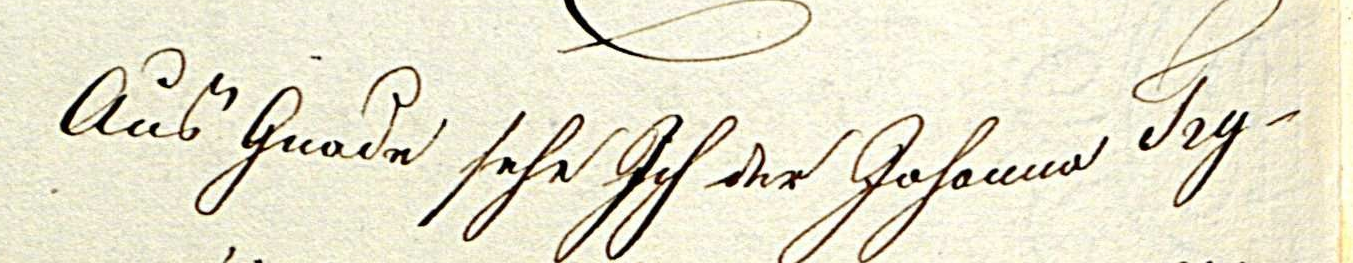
Aus Gnade sehe Ich der Johanna Try¬
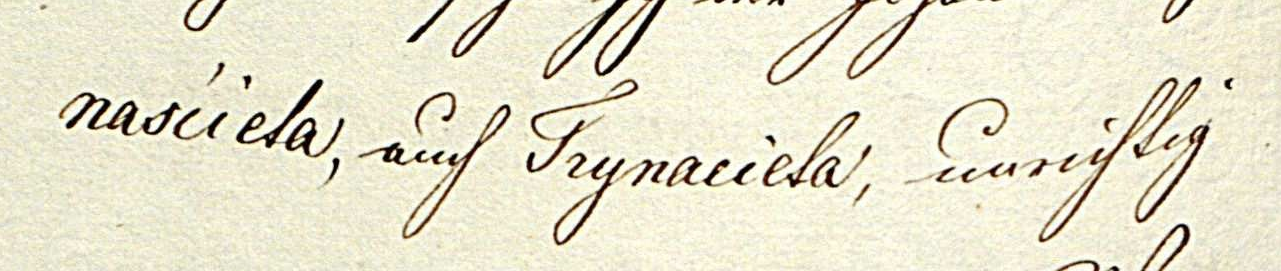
naścieta, auch Trynacieta, unrichtig
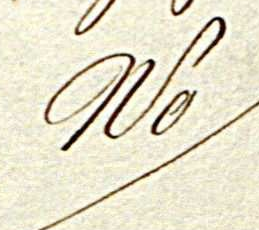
Ano
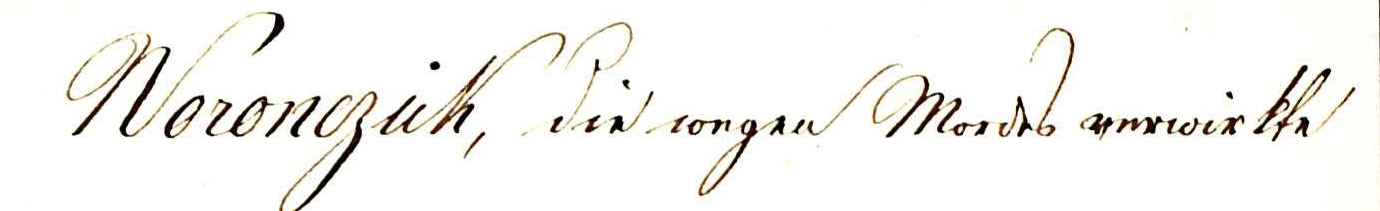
Woronczuk, die wegen Mordes verwirkte
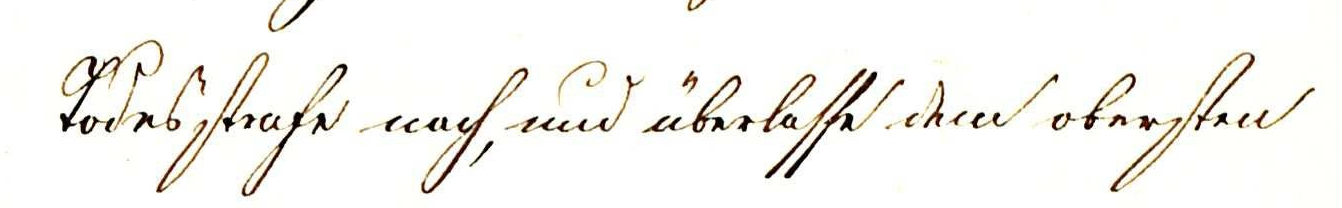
Todesstrafe nach, und überlasse dem obersten
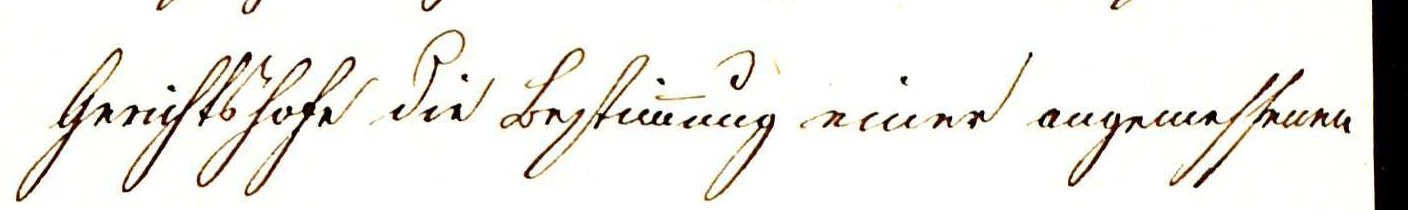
Gerichtshofe die Bestimmung einer angemessenen
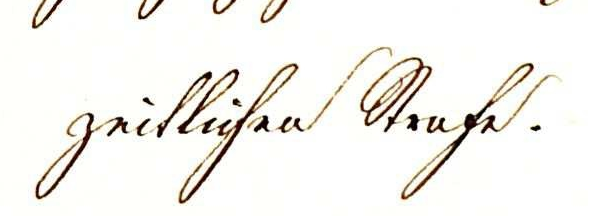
zeitlichen Strafe.
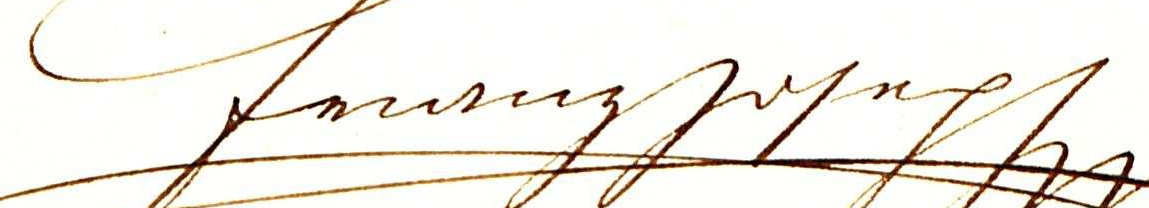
Franz Joseph
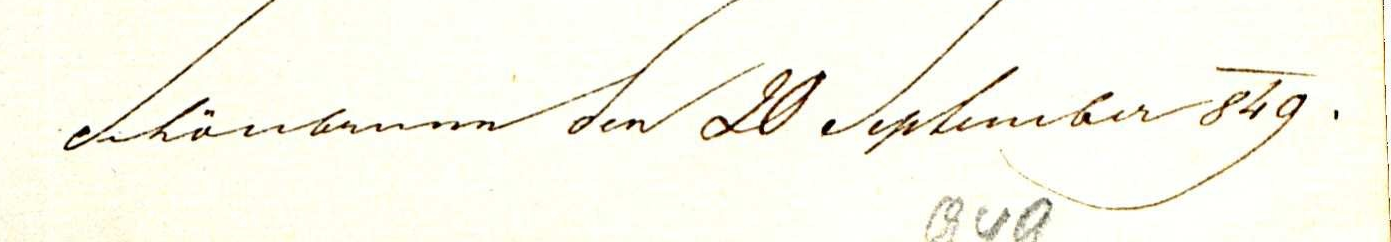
Schönbrunn den 20. September 849
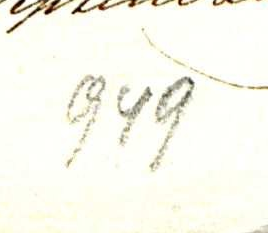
949
